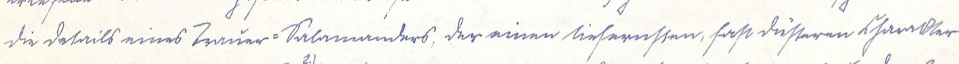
die Details eines Trauer-Salamanders der einen tiefersten, fast düsteren Charakter
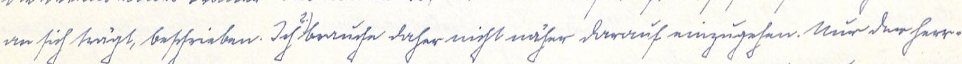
an sich trägt, beschrieben. Ich2.) brauche daher nicht mehr darauf einzugehen. Nur der herr-
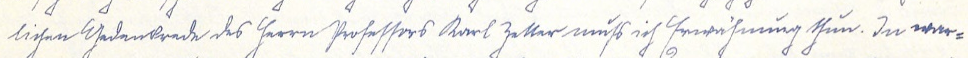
lichen Gedenkrunde des Herrn Professors Kalr Zetter muss ich Erwähnung thun. In war-
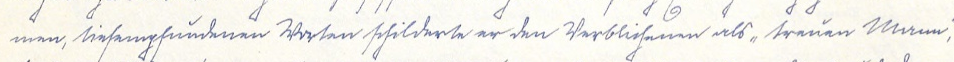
men, tiefempfundenen Worten schilderte er den Verblichenen als "treuene Mann",
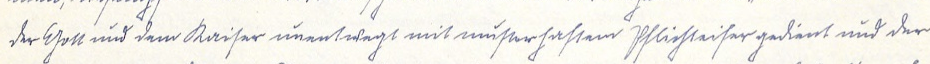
der Gott und dem Kaiser unentwegt mit musterhaftem Pflichteifer gedient und der
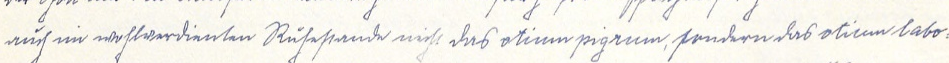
auch im wohlverdienten Ruhestande nicht das otium pigrum, sondern das otium labo-
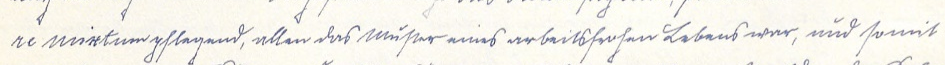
re mixtum pfelegend, allen das Muster eines arbeitsfrohen Lebens war, und somit
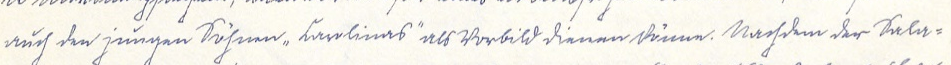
auch der jungen XXX "Carolinas" als Vorbild dienen könne. Nachdem der Sala-
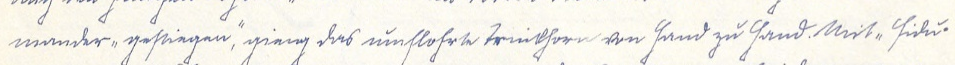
mander "gestiegen", gieng das umflohrte Trinkhorn von Freund zu Freund. Mit "Fidu-
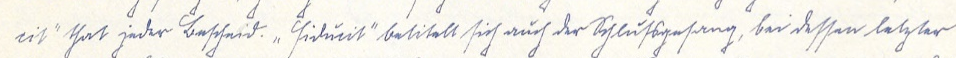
cit" that jeder Bescheid. "Fiducit" betitelt sich auch der Schlussgesang, bei dessen letzter
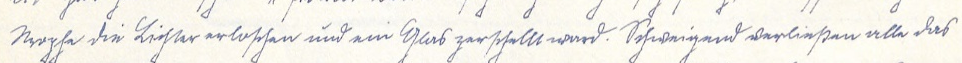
Strophe die Lichter erloschen und ein Glas zerschellt wurd. Schweigend verließen alle das
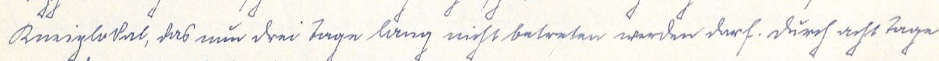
Kneiplokal, das nun drei Tage lang nicht betreten werden darf. Durch acht Tage
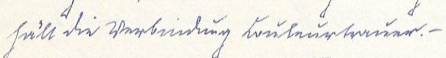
hält die Verbindung Couleurtrauer. -
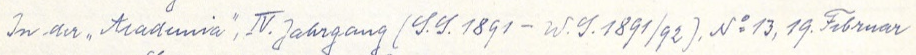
In der "Academia", IV. Jahrgang (S. S. 1891-W. S. 1891/92), Nr. 13, 19. Februar
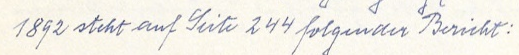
1892 steht auf Seite 244 folgender Bericht:
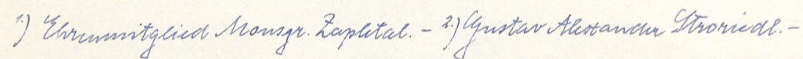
1.) Ehrenmitglied Monsgr. Zapletal. - 2.) Gustav Alexander Stroriedl.-
